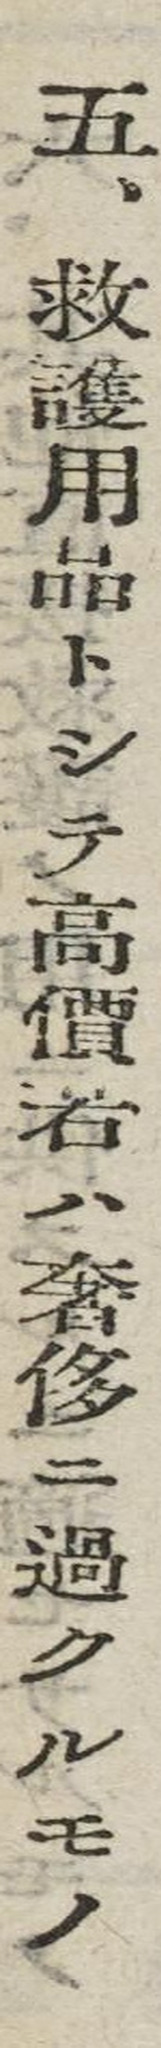五、救護用トシテ高価若ハ奢侈ニ過クルモノ

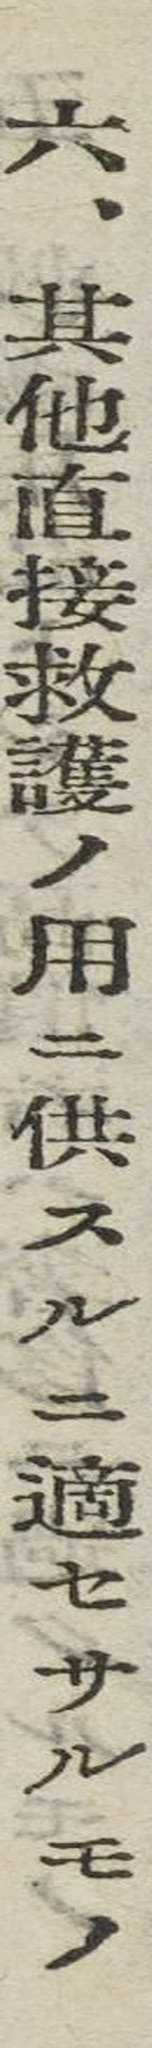六其他直接救護ノ用ニ供スルニ適セサルモノ
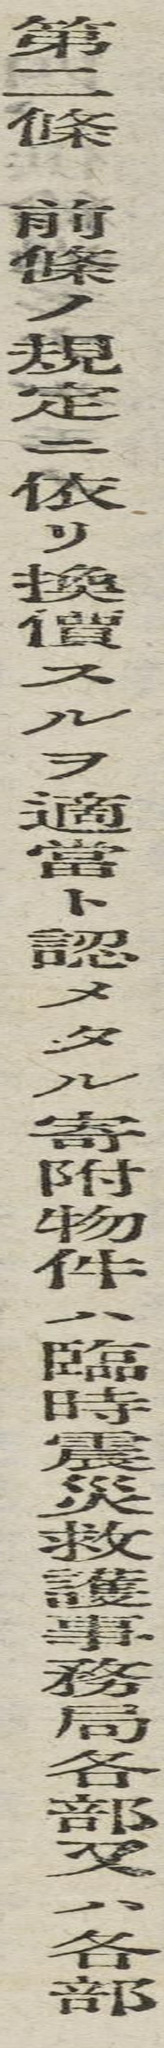第ニ條前條ノ規定ニ依リ換価スルヲ適当ト認メタル寄附物件ハ臨時震災救護事務局各部又ハ各部
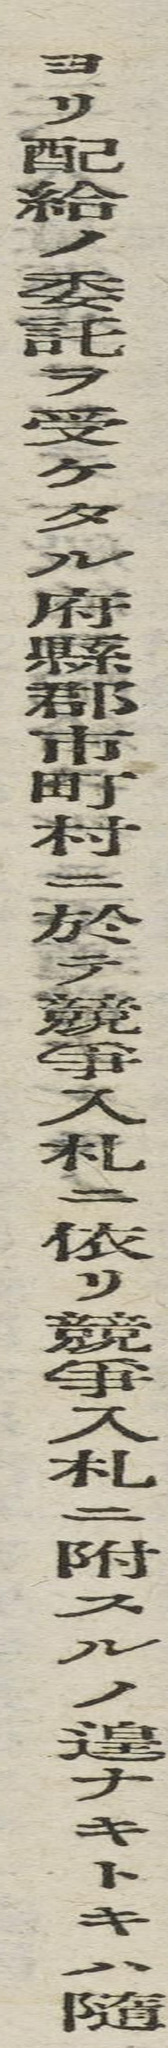ヨリ配給ノ委託ヲ受ケタル府県郡市町村ニ於テ競争入札ニ依リ競争入札ニ附スルノ遑ナキトキハ随
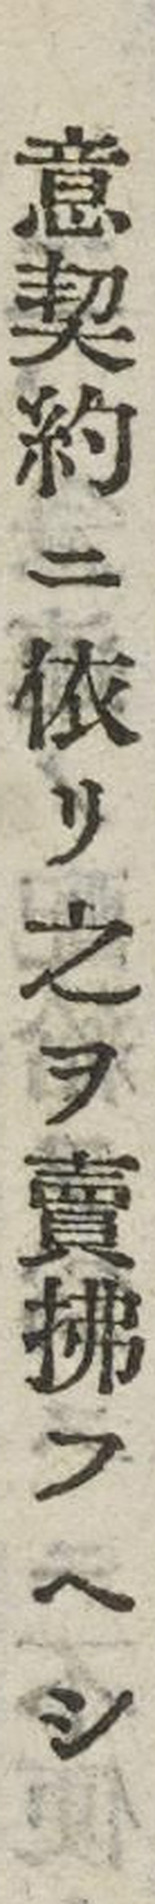意契約ニ依リ之ヲ売払フヘシ
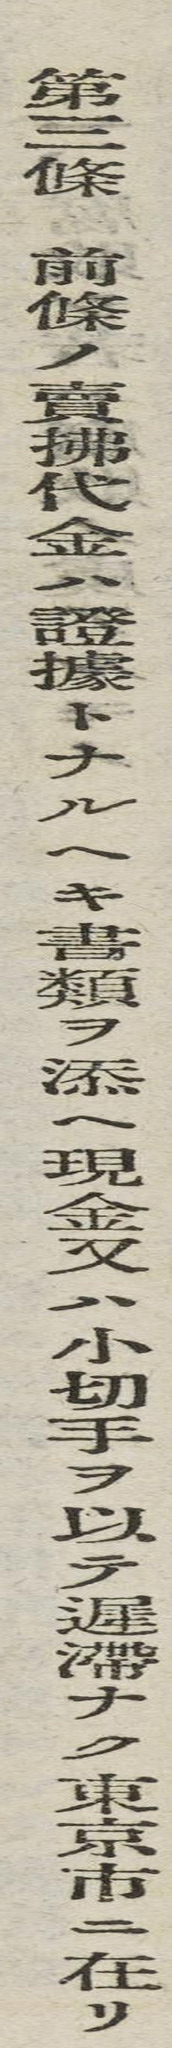第三條前條ノ売払代金ハ証拠トバルヘキ書類ヲ添ヘ現金又ハ小切手ヲ以テ遅滞ナク東京市ニ在リ
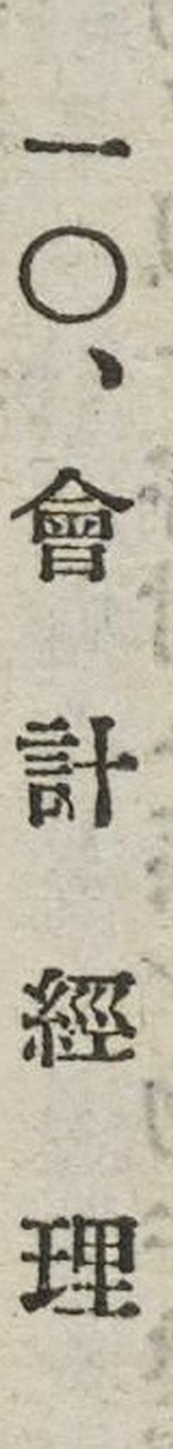一〇、会計経理
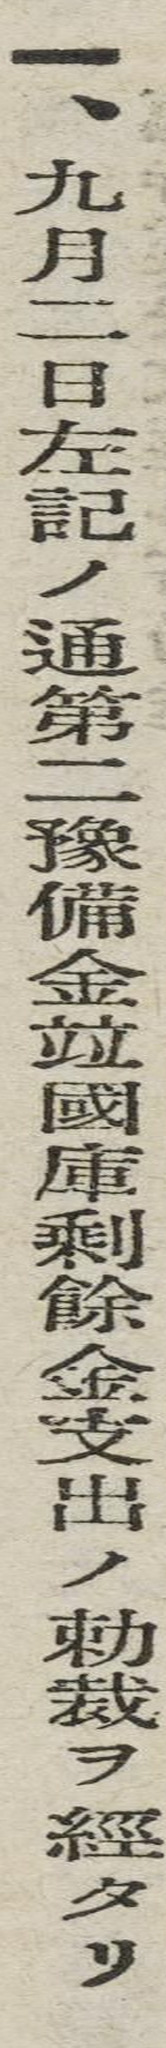一、九月二日左記ノ通第二予備金並国庫剰余金支出ノ勅裁ヲ経タリ
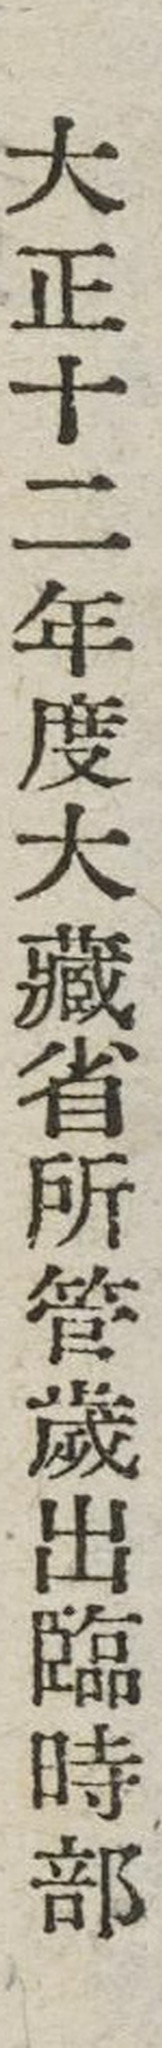大正十二年度大蔵省所管歳出臨時部
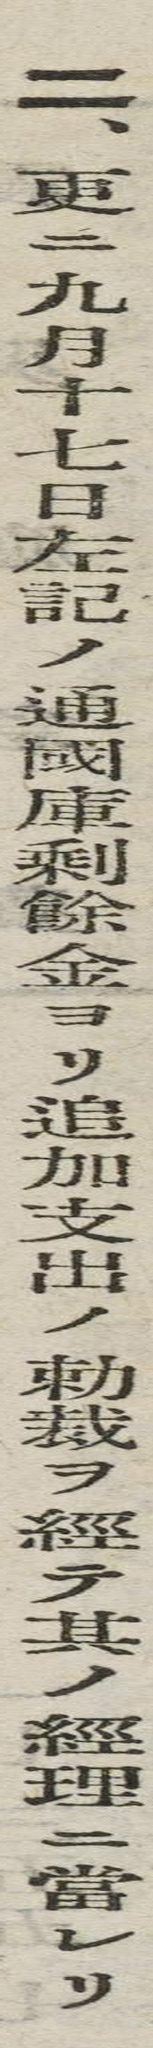ニ、更ニ九月十七日左記ノ通国庫剰余金ヨリ追加支出ノ勅裁ヲ経テ其ノ経理ニ当レリ
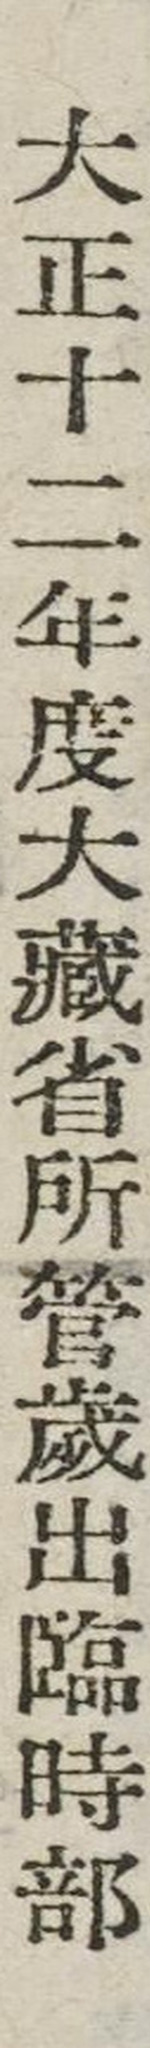大正十二年度大蔵省所管歳出臨時部
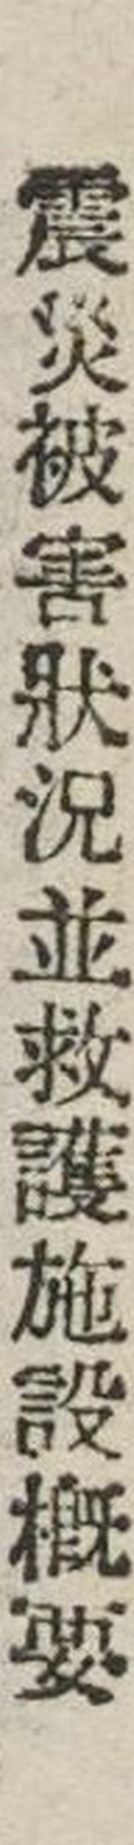震災被害状況並救護施設概要

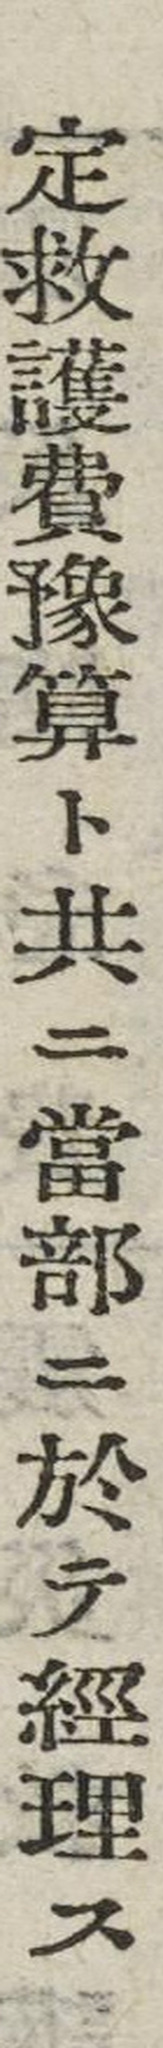定救護費予算ト共ニ当部ニ於テ経理ス
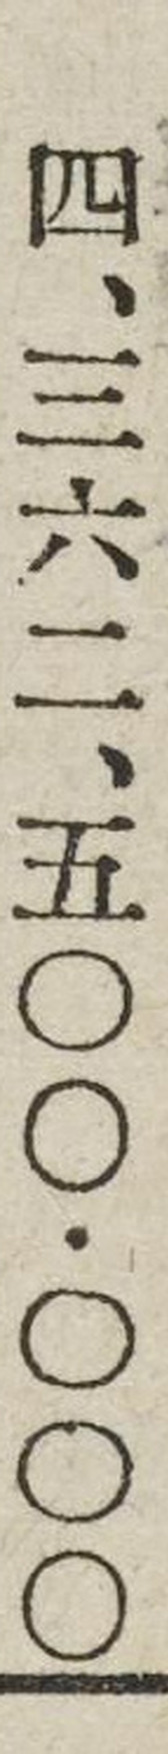食糧費四、三六二、五〇〇・〇〇〇
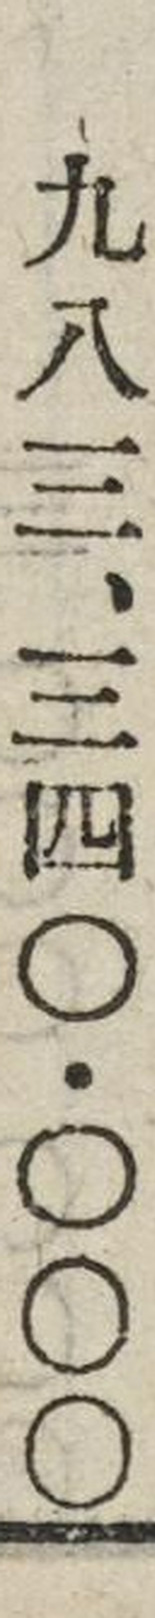警備費九八三、三四〇・〇〇〇
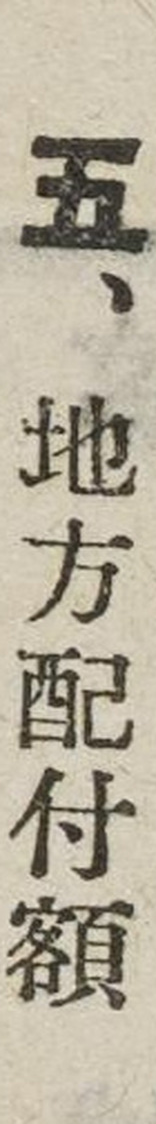五、地方配布額
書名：震災被害状況並救護施設概要
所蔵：東京大学地震研究所図書室 Earthquake Research Institute Library, The University of Tokyo, JAPAN
